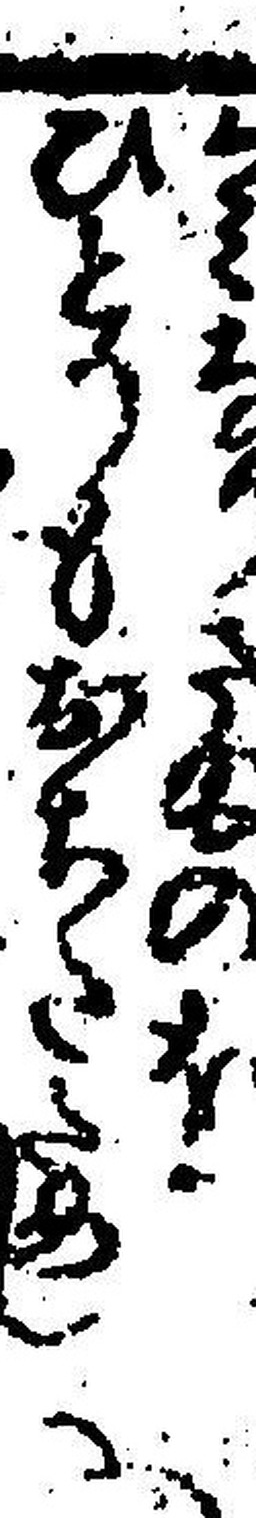ひとりもおちたためし
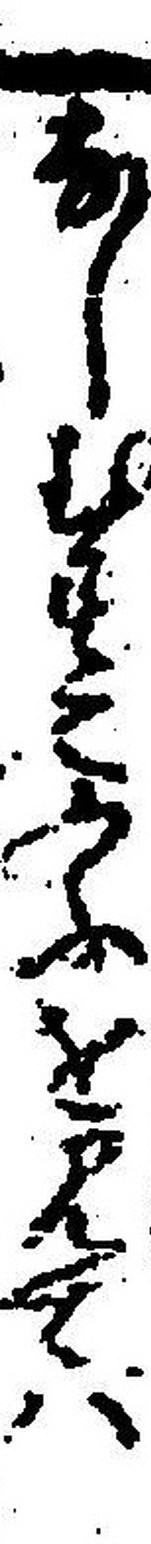なしむすこかふを見ては
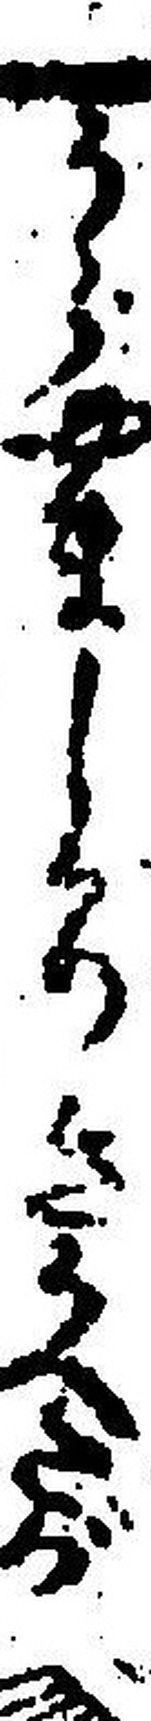うらやましがりきかへたが
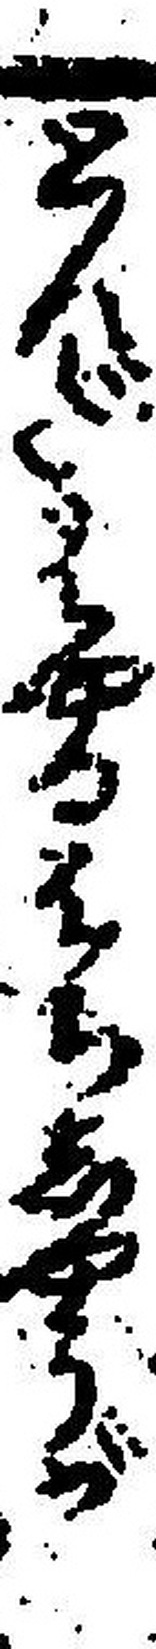とんだはやるはちしやうが
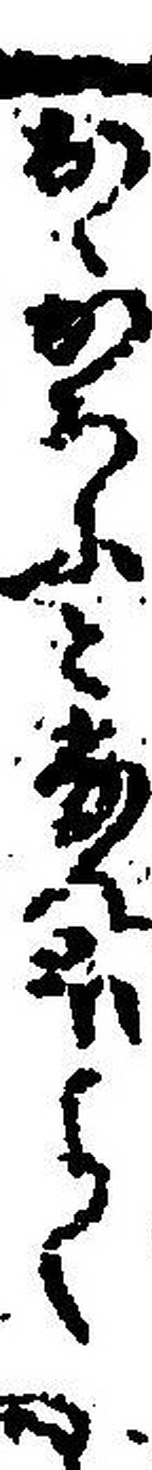おゝかろふとなんほよく
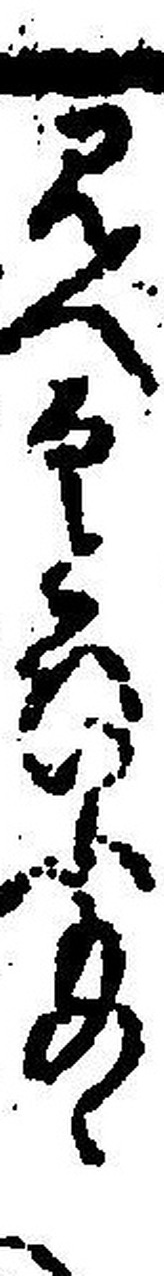見へるとはいふものゝ
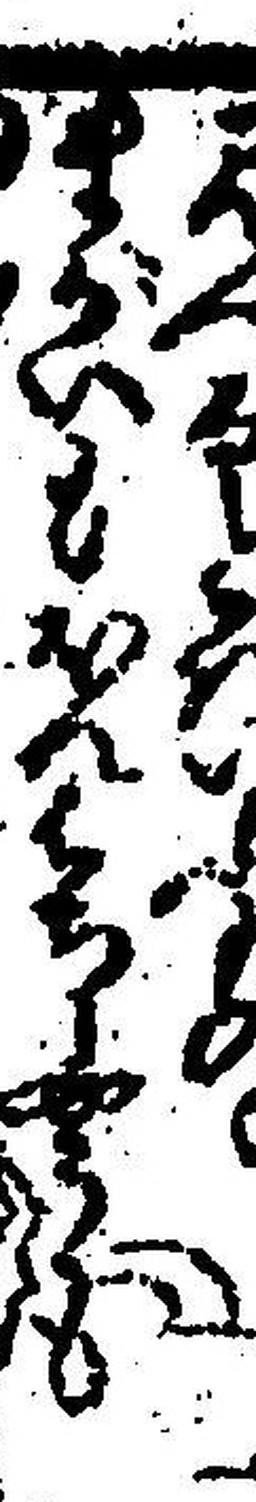まがいもほんはちしやうも
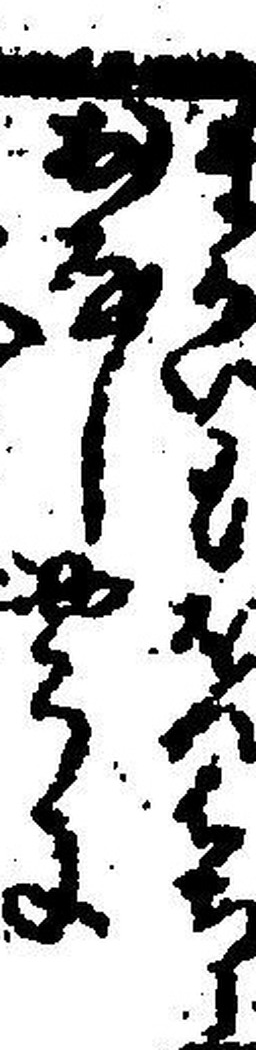おなしやうに
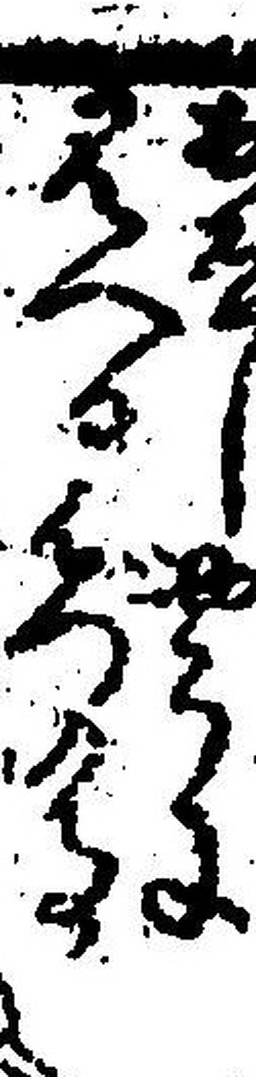見へるはづの事
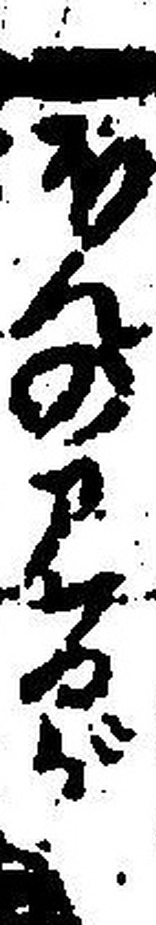ほんの見るが
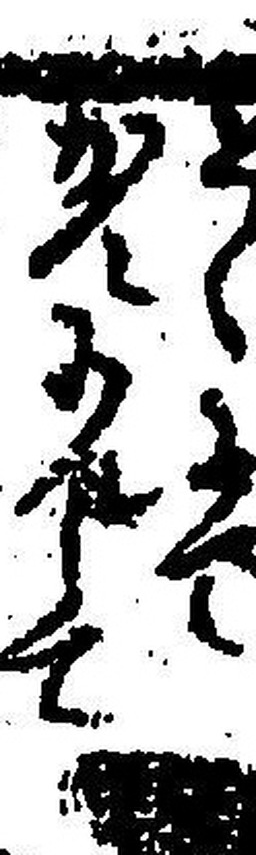かんにんして
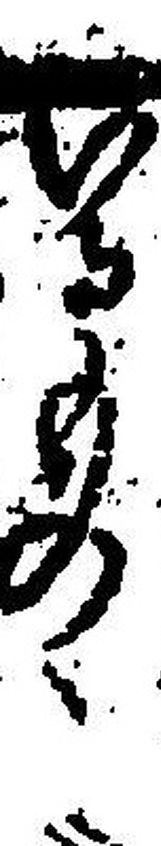いるものゝ
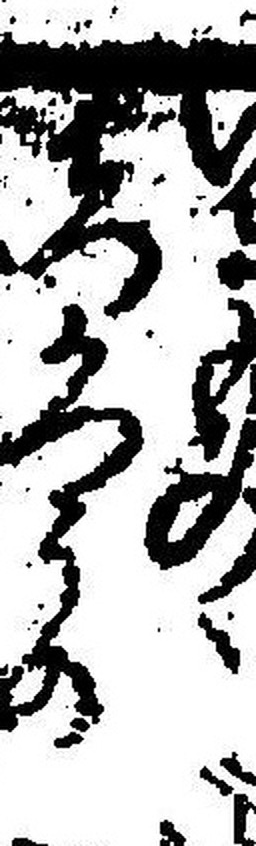はつかつうの
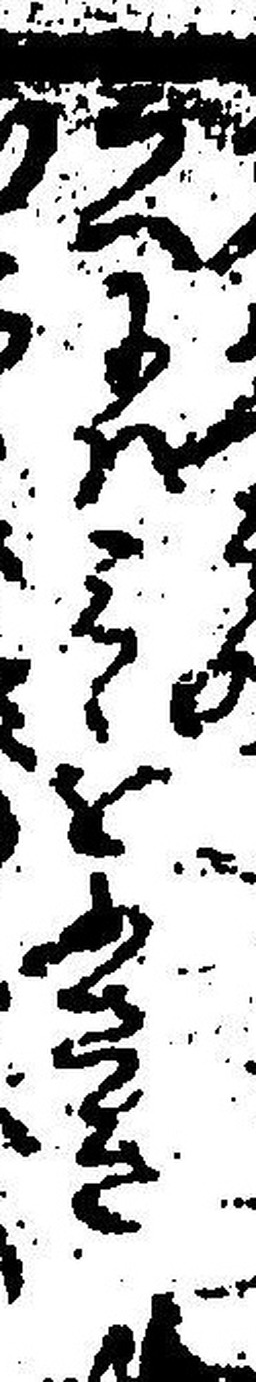こへにはみゝをふさき
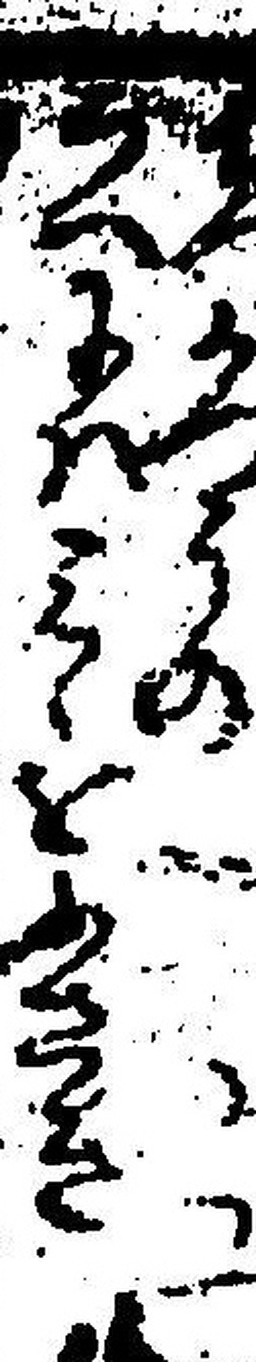こへにはみゝをふさき
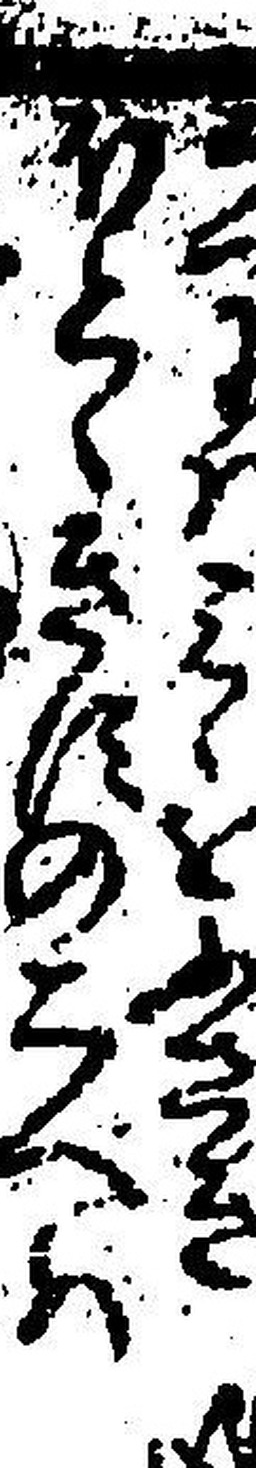ほとゝきすのこへは
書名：天竺儲之筋 / 市場通笑作
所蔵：東京大学総合図書館 General Library in the University of Tokyo, JAPAN
